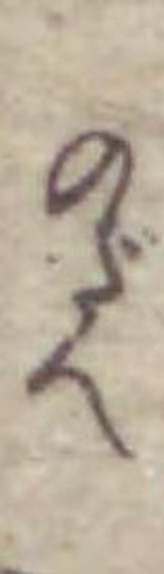のだへ
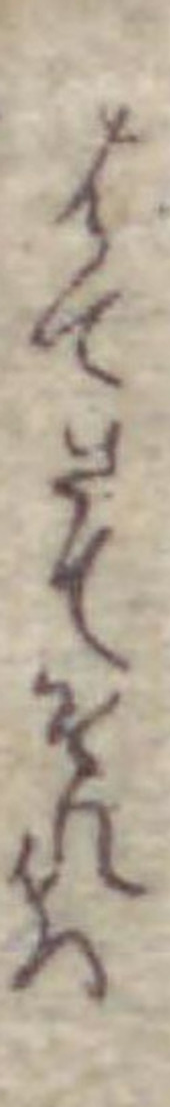はてさてそれは
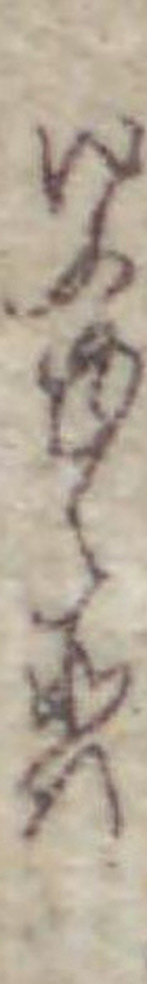けふゆく所は
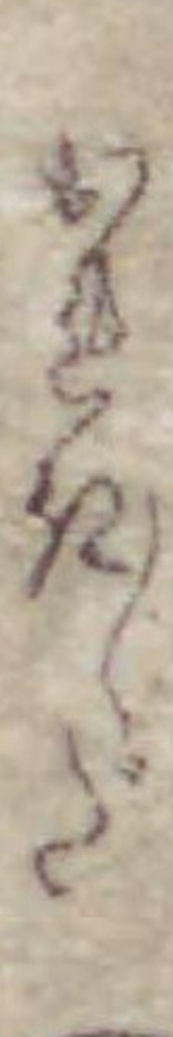おれき〳〵だ
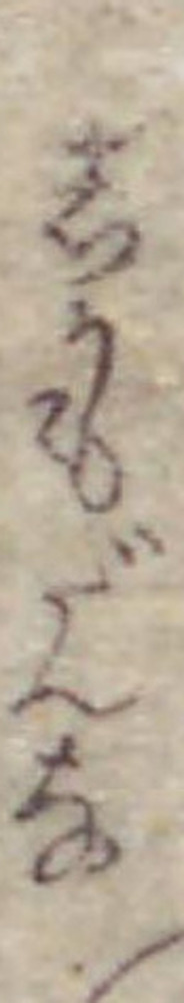しかもだんな
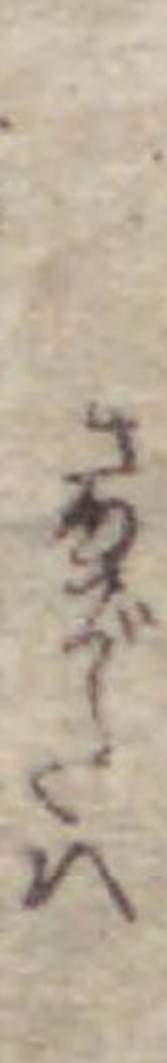さまがたは
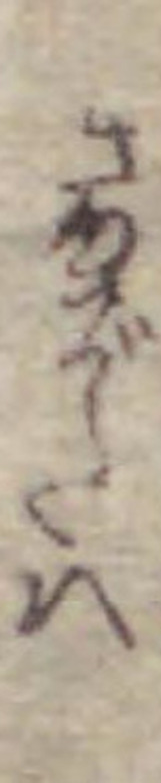さまがたは
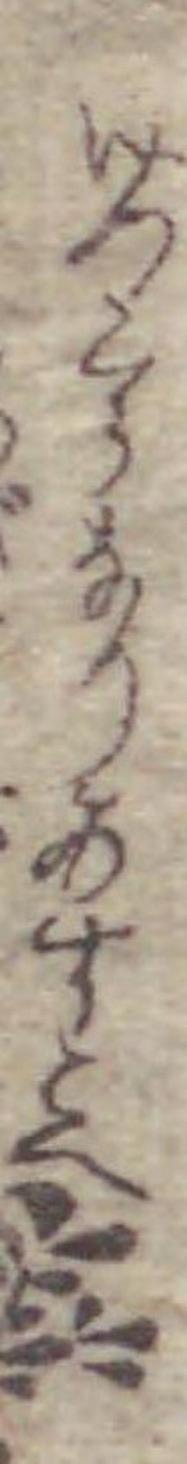けつこうなりあすこへ
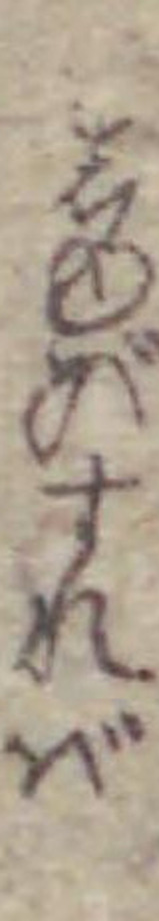しゆびすれば
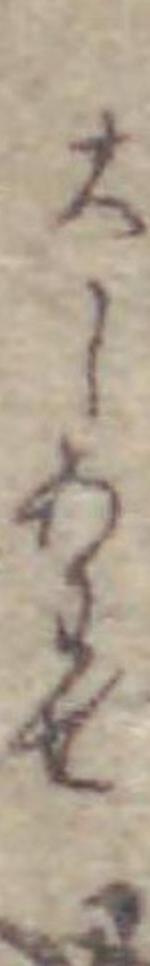大しあわせ

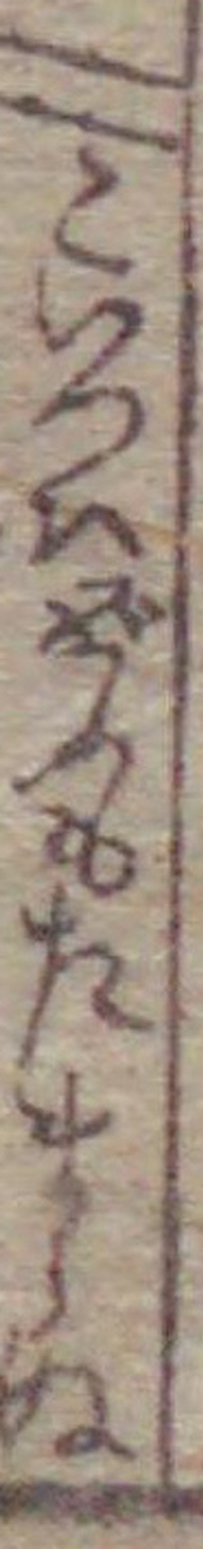こいつはどふもたまらぬ
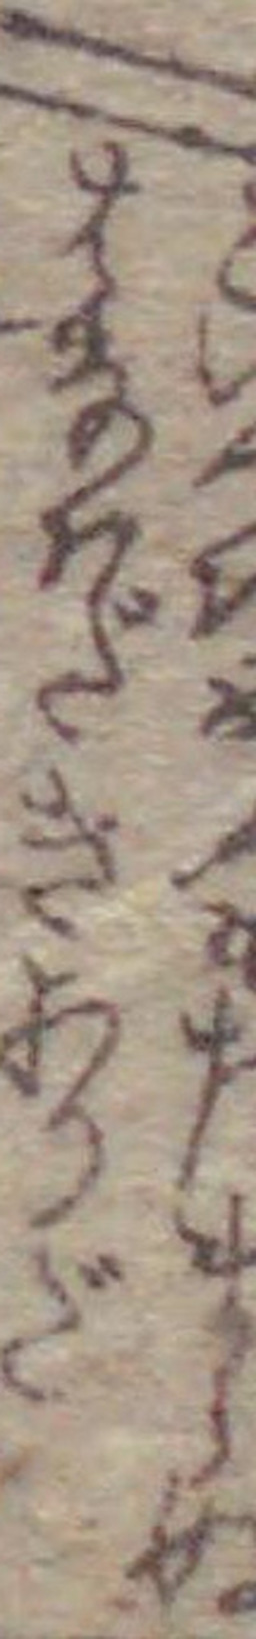はなはだきにりだ
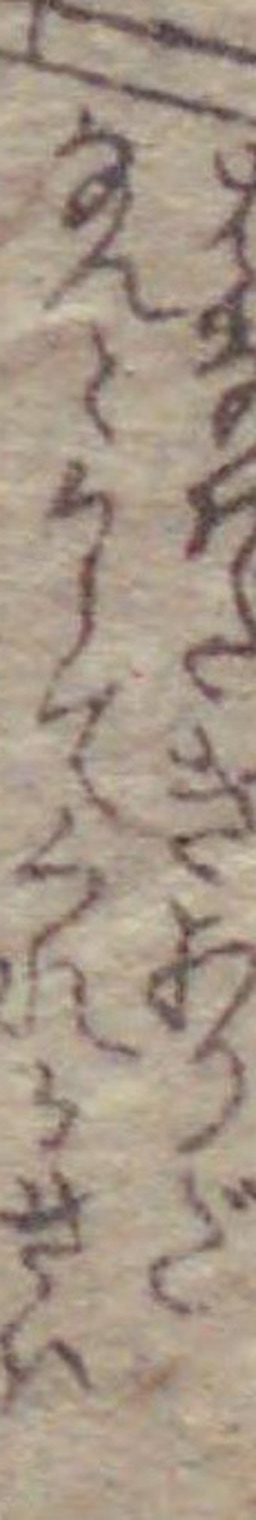なんとかしてくれるきは
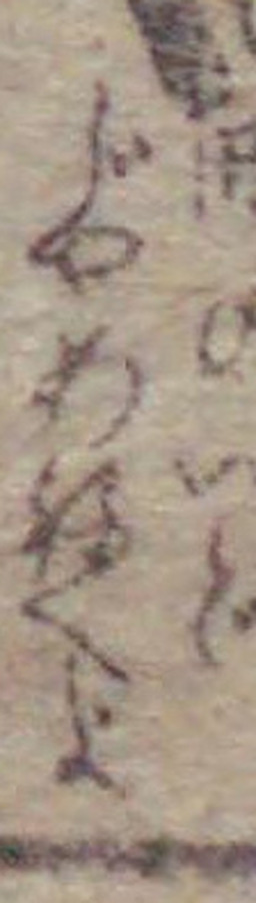じやあねへよ
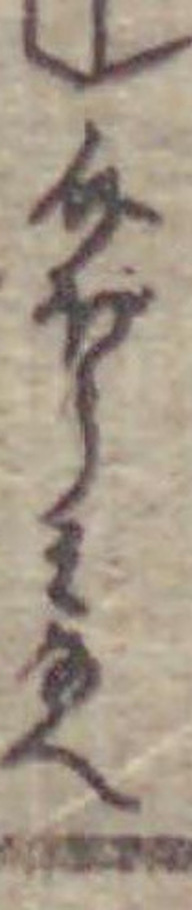介ぼうみ給へ
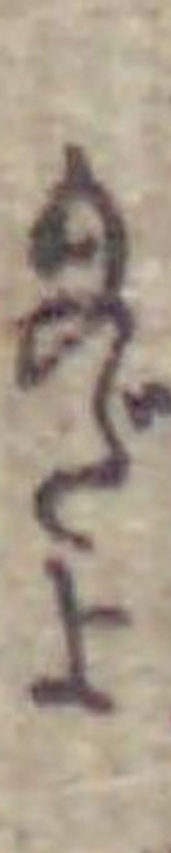ものだよ
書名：嗚呼不侭世之助噺 : 3巻
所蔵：国立国会図書館 National Diet Library, JAPAN
